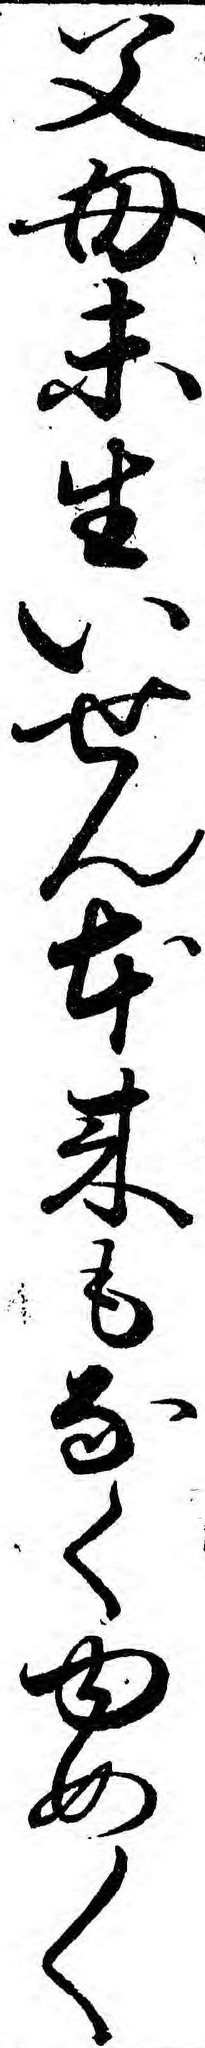父母未生いぜん本来もなくゆめ〳〵
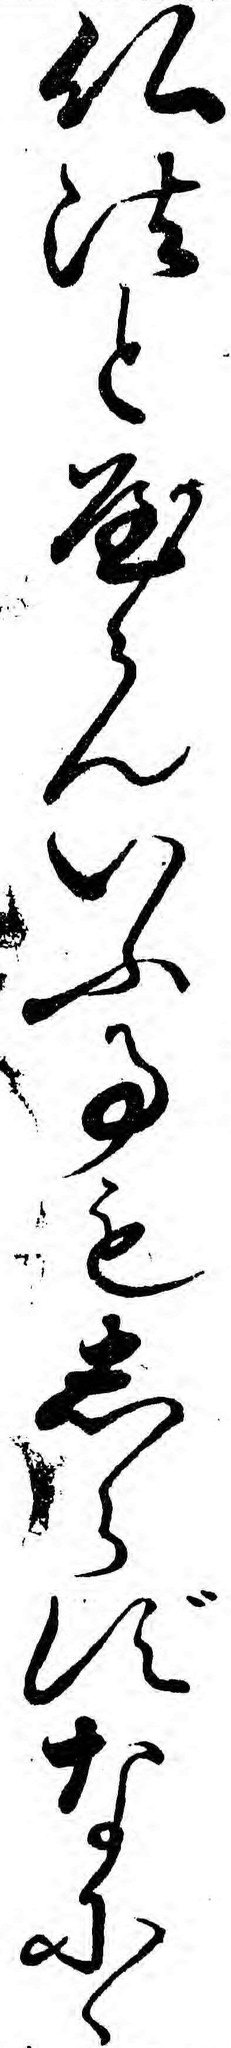仏法とやらんいふ事もしらずなにゝ
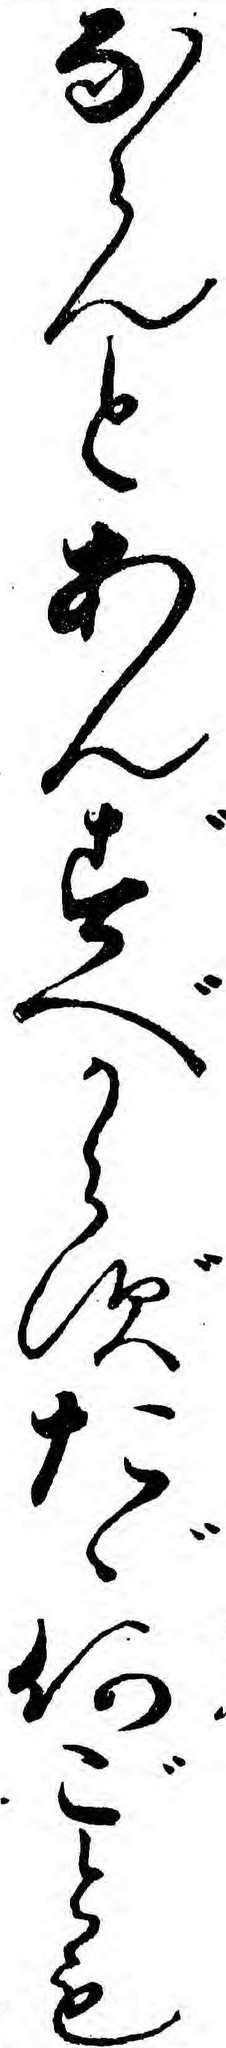ならんとあんずべからずたゞ何ごとも
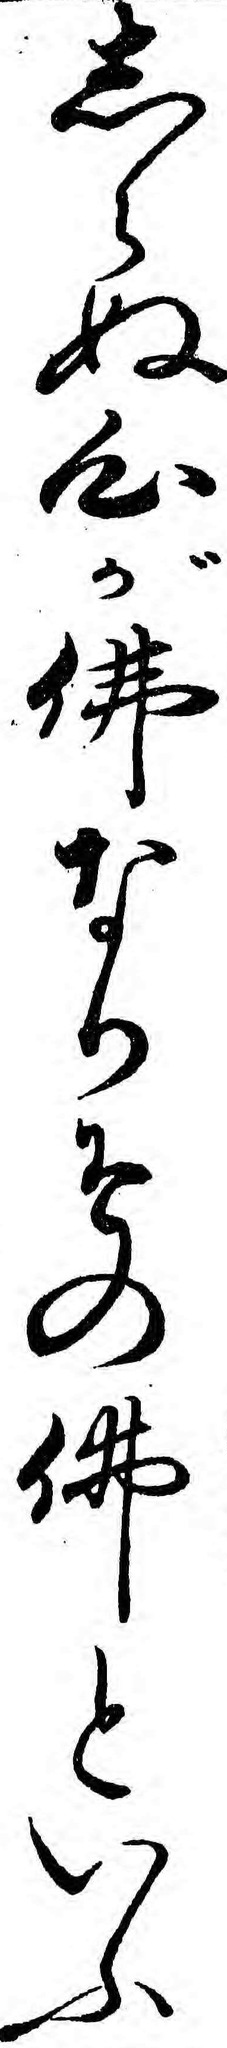しらぬ心が仏なりその仏といふ
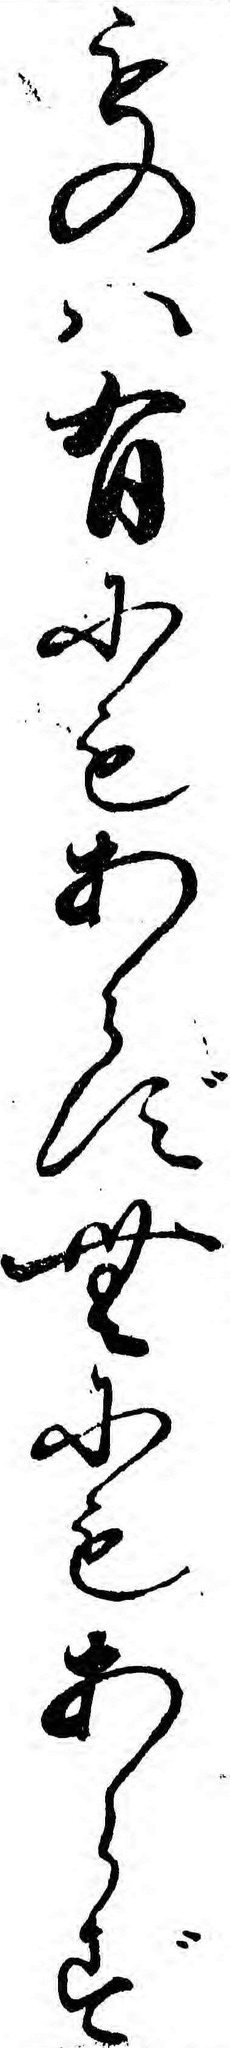ものは有にもあらず無にもあらず
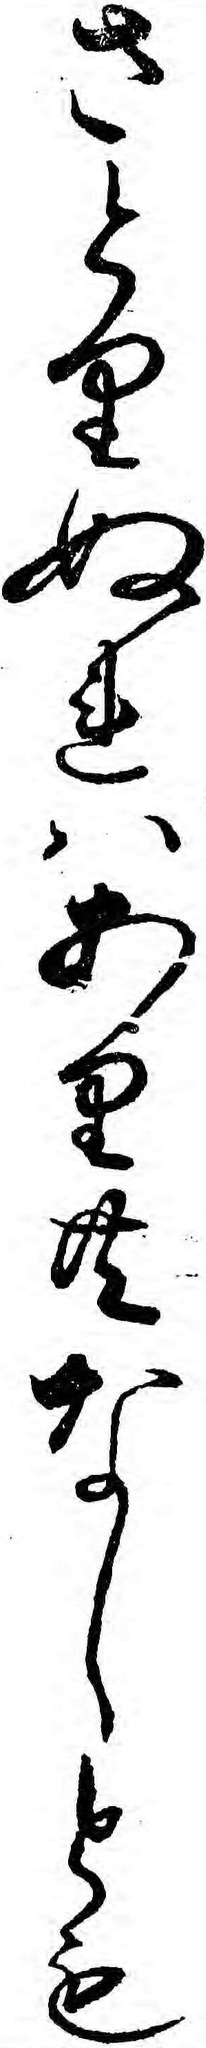さとりぬればあり共なしとも

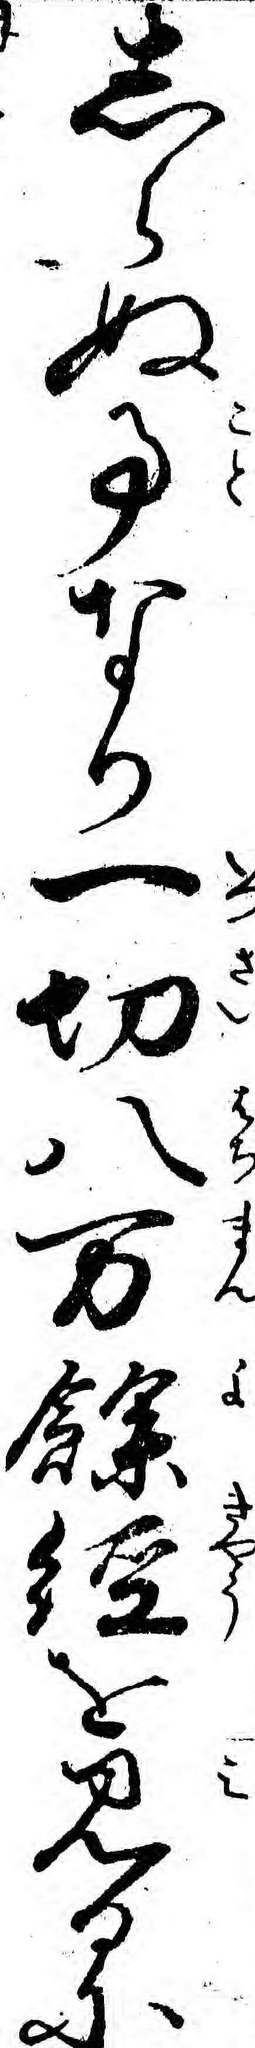しらぬ事なり一切八万余経を見るに
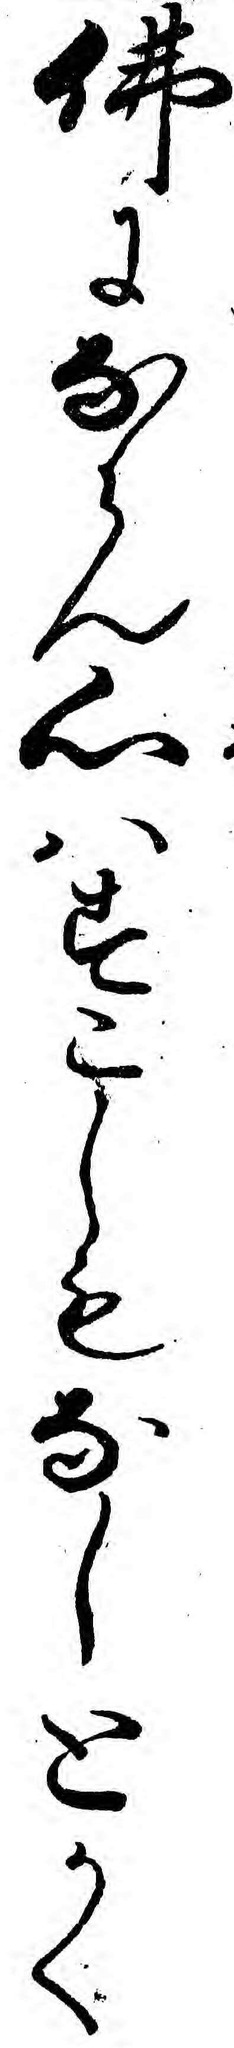仏にならん心はすこしもなしとかく
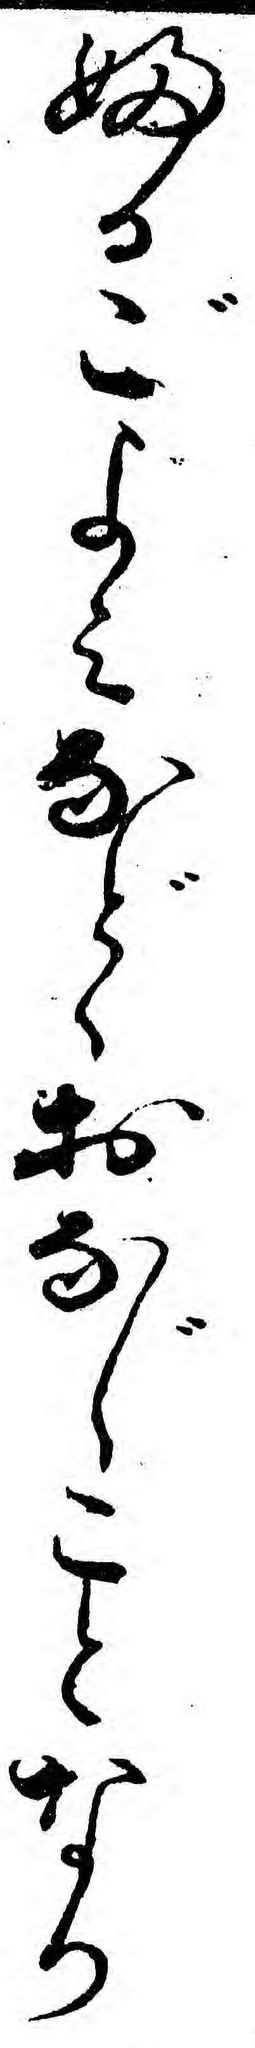ふるごよみなどゝおなじことなり
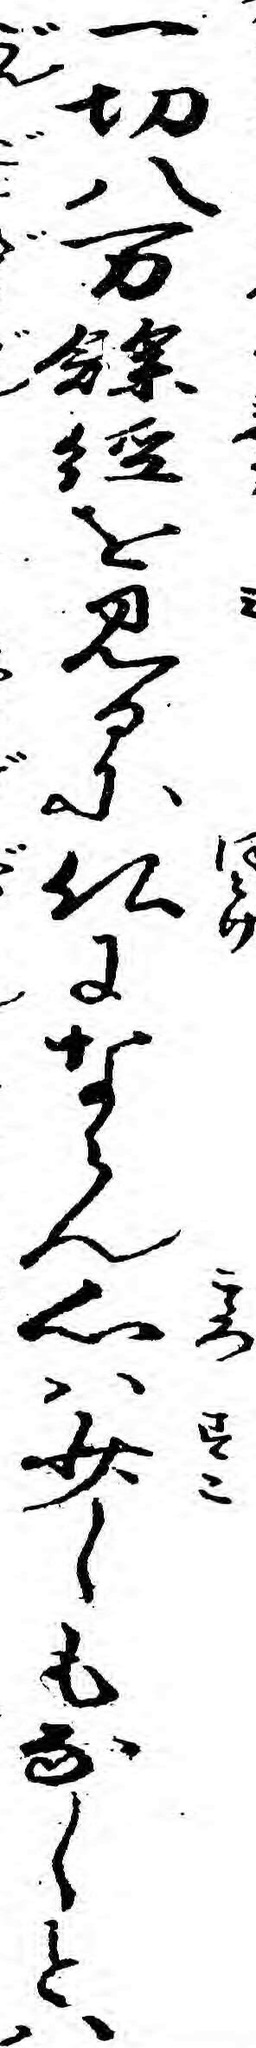一切八万余経を見るに仏にならん心は少しもなしとは
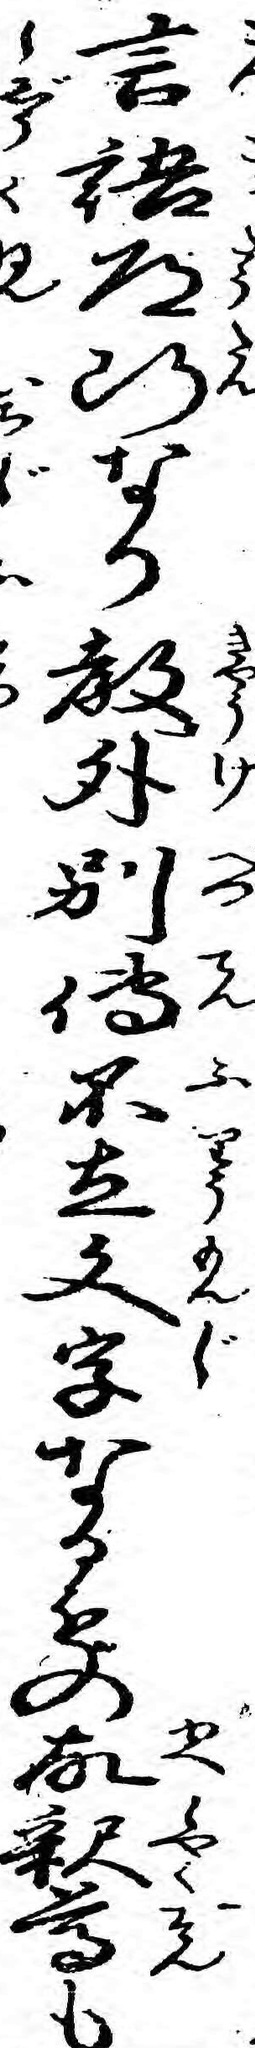言語道断なり教外別伝不立文字なるもの故釈尊も
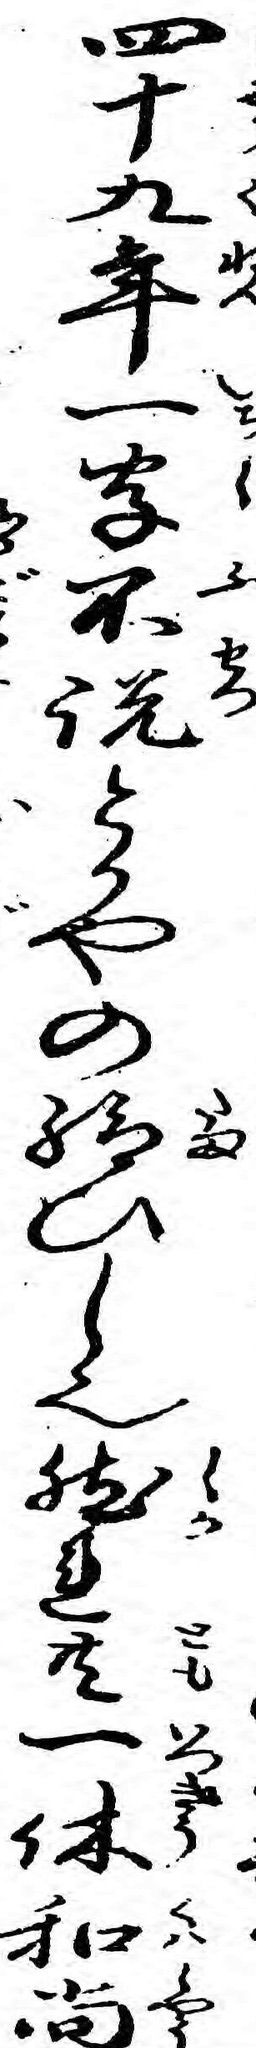四十九年一字不説とかやの給ひし也然れ共一休和尚
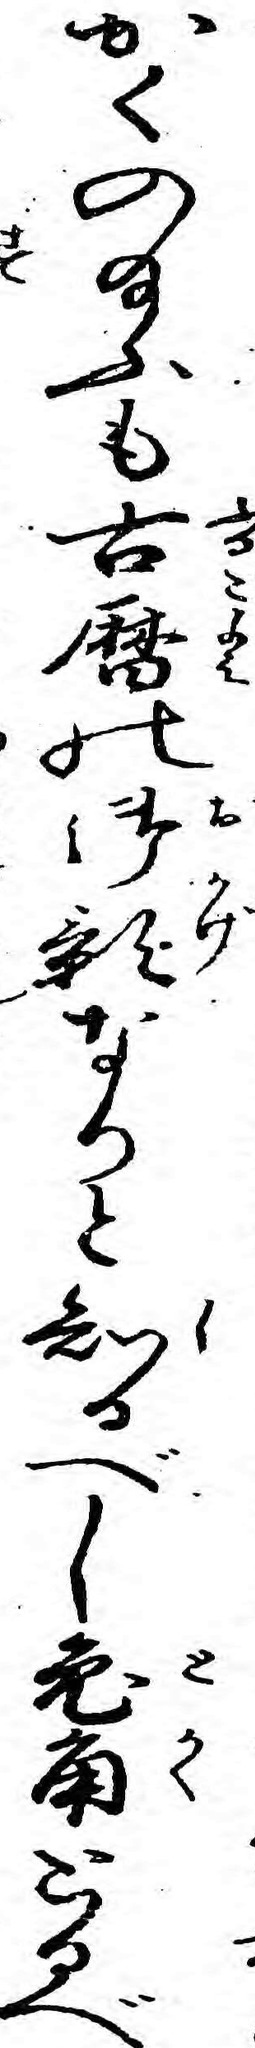かくの給ふも古暦の御影なりと知るべし兎角とるべ
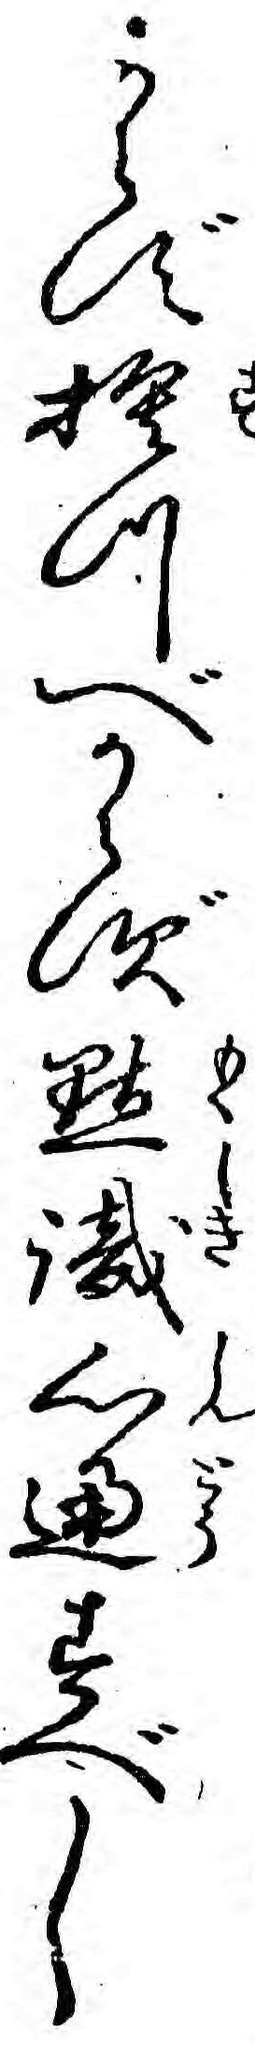からず捨つべからず黙識心通すべし
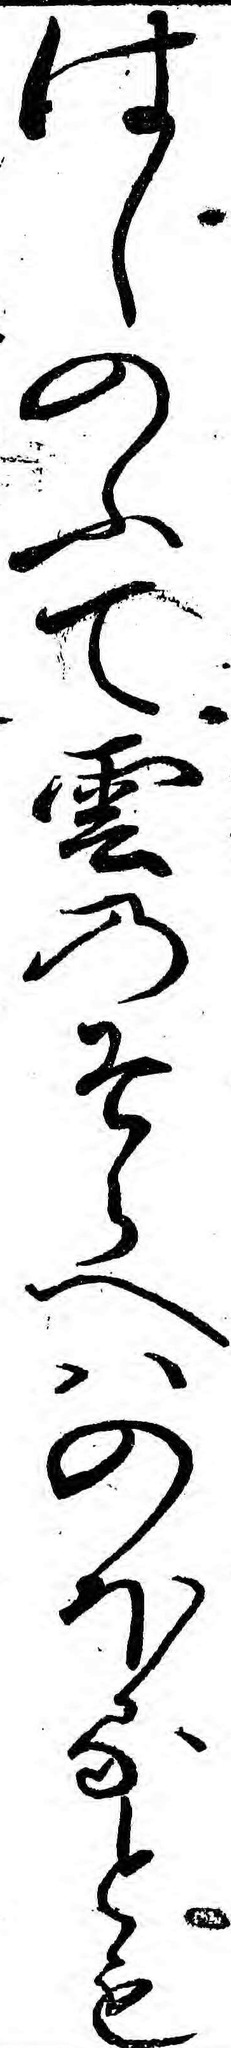はしのふて雲のそらへはのほるとも
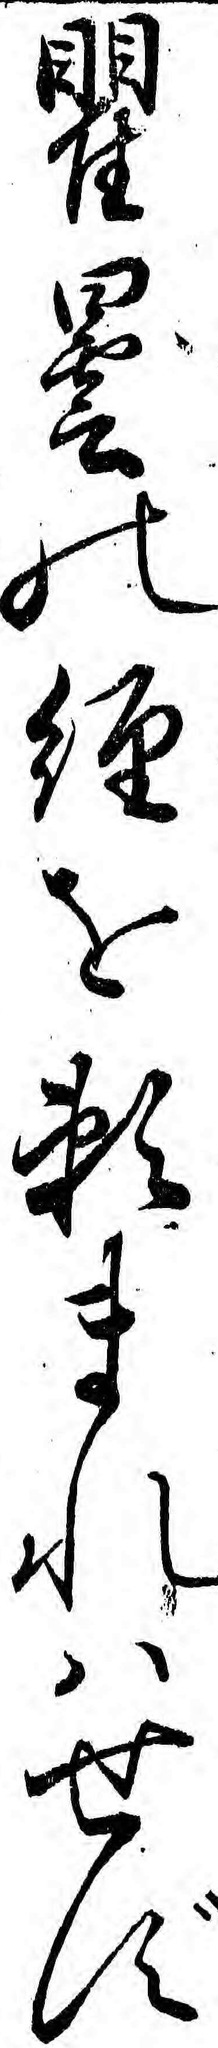瞿曇の経を頼まれはせず
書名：目なし用心抄
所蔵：国文学研究資料館
